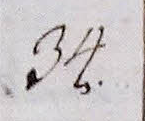34.
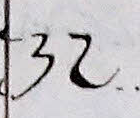32
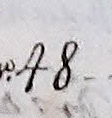48
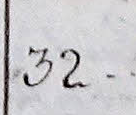32
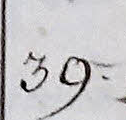39
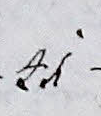41
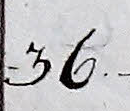36
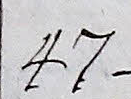47
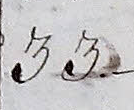33
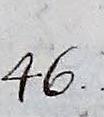46
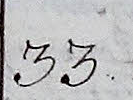33
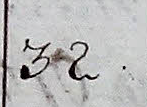32
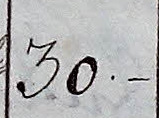30.
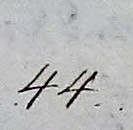44
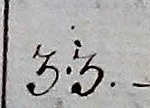33.
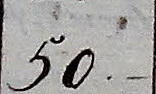50.
